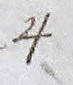4
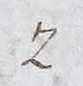2
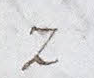2
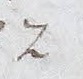2
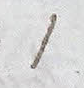1
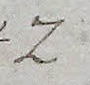2
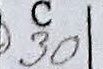30
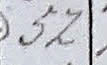52
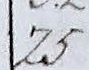25
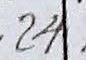24
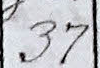37
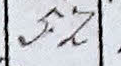52
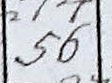56
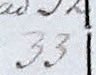33
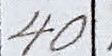40
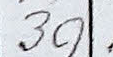39
